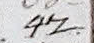42
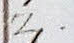2
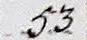53
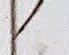1
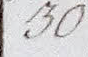30
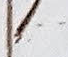1
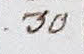30
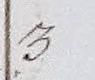3
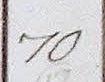70
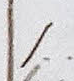1
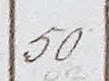50
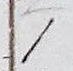1
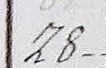28
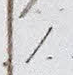1
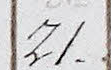21
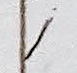1
